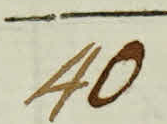40
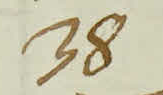38
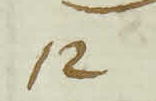12
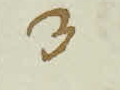3
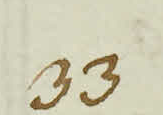33
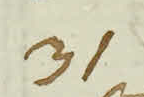31
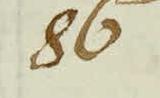86
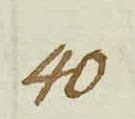40
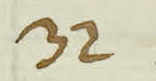32
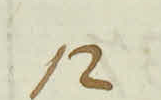12
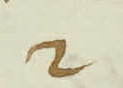2
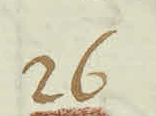26
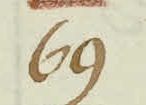69
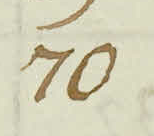70
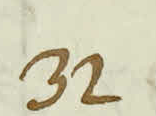32
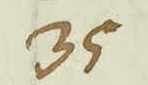35
